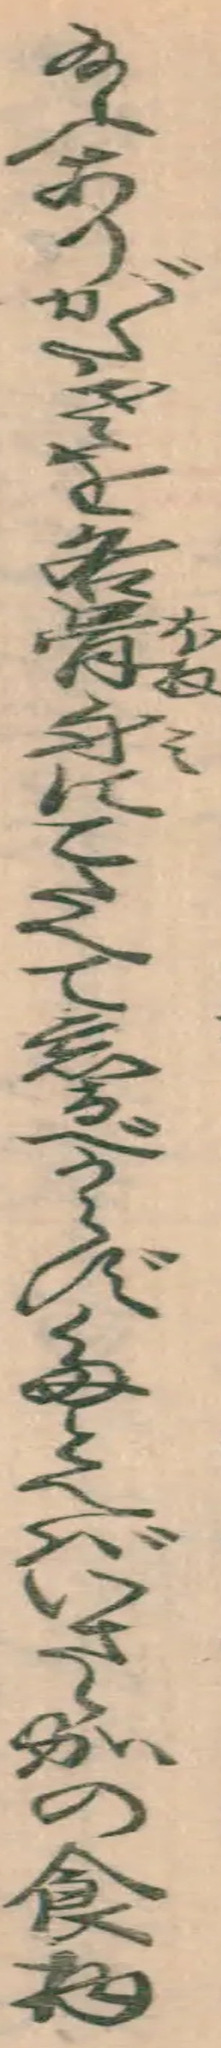給ふありがたさを各骨身にこたへて忘るべからずたとへばいさゝかの食物
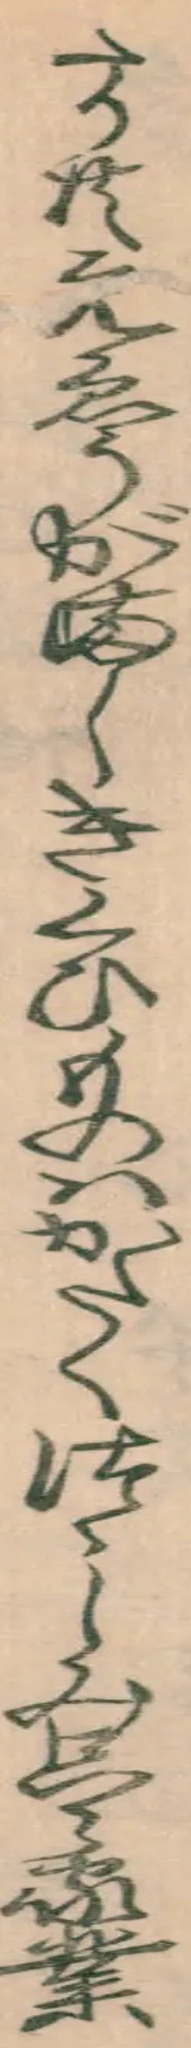たり共えゑうがましきくひものはかたくつゝしみ只々家業
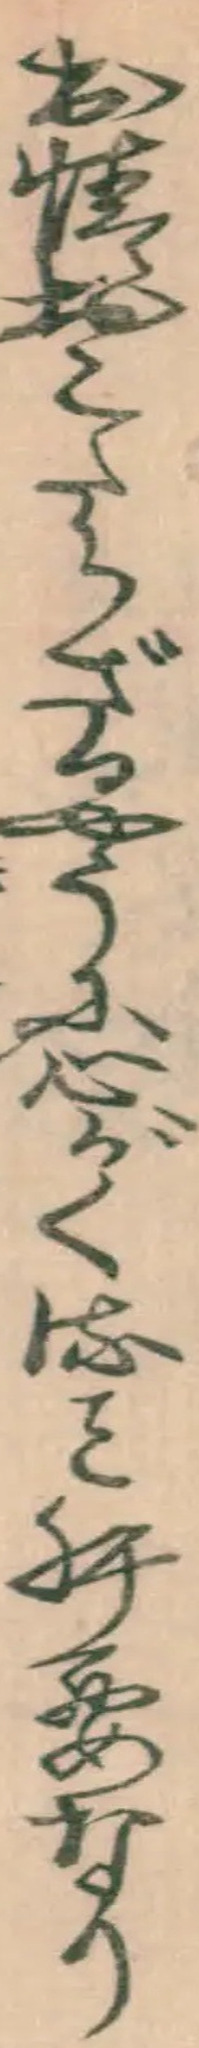お情おこたらざるやうに心がくること肝要なり
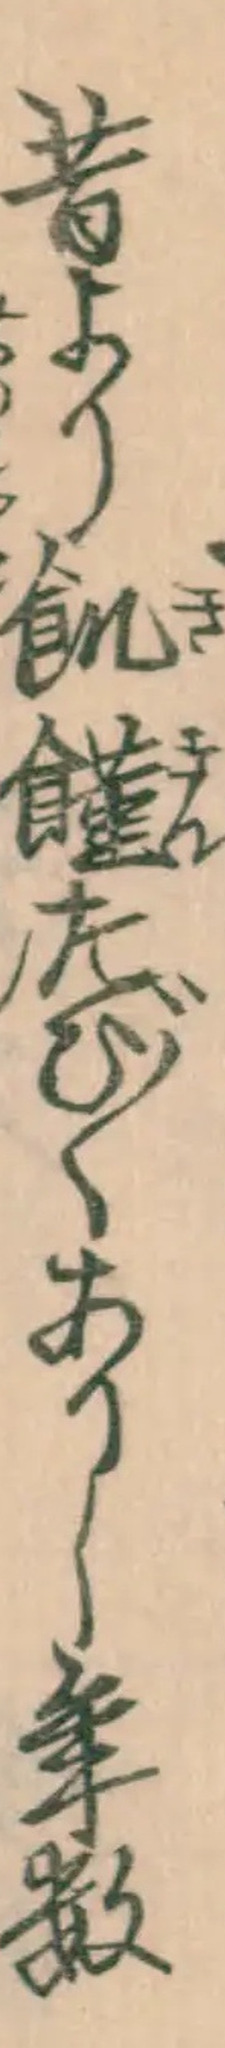昔より飢饉たび〳〵ありし年数
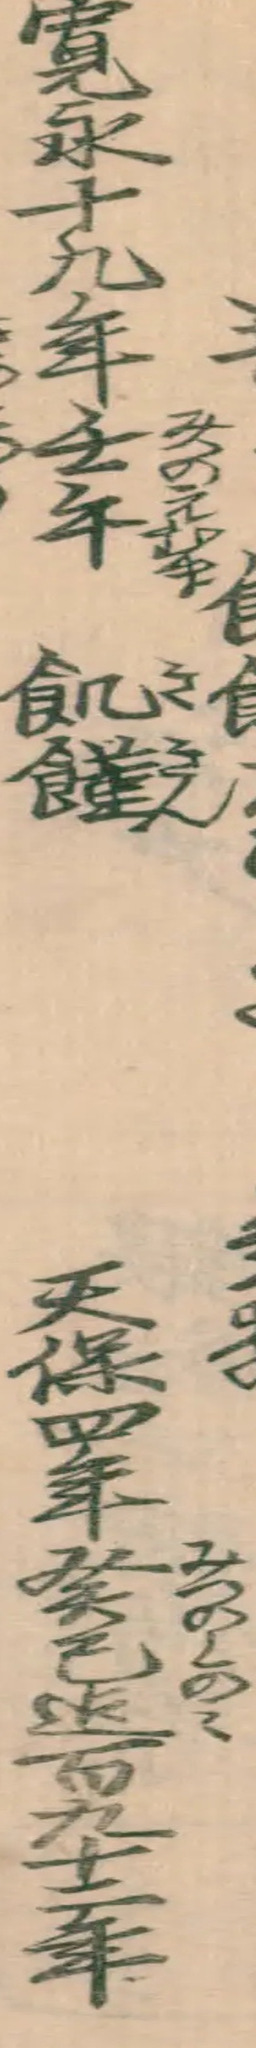寛永十九年壬午飢饉天保四年癸巳迄百九十二年
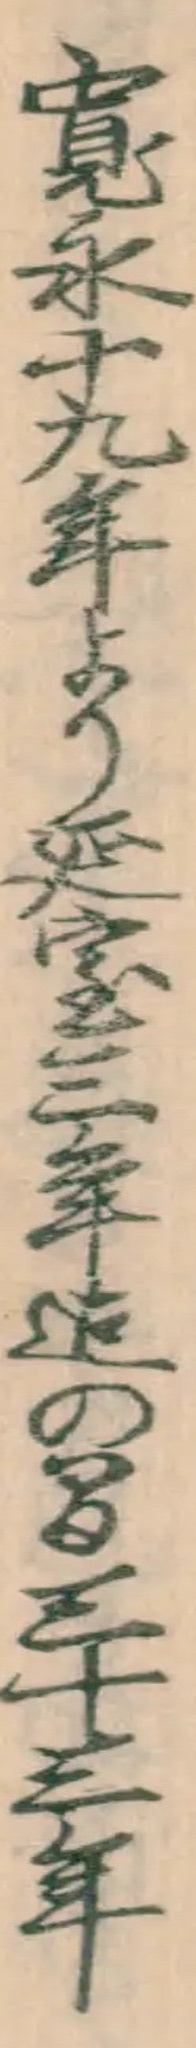寛永十九年より延宝三年迄の間三十三年
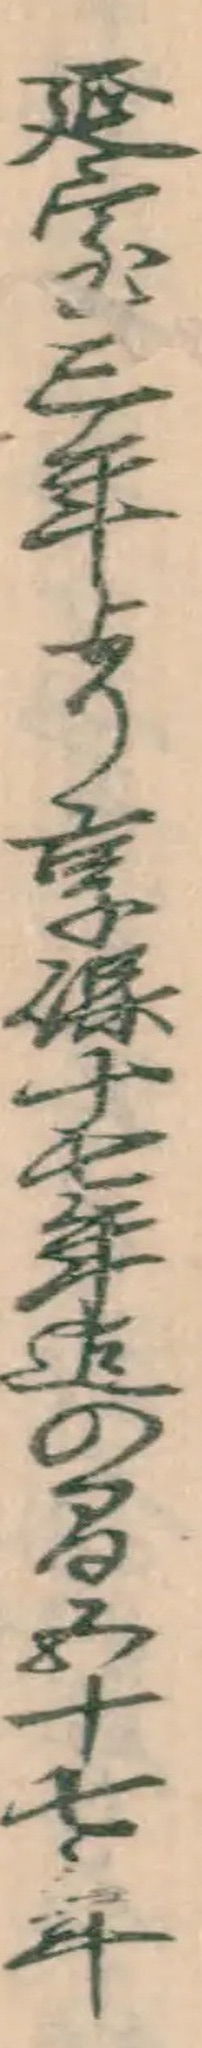延宝三年より享保十七年迄の間五十七年
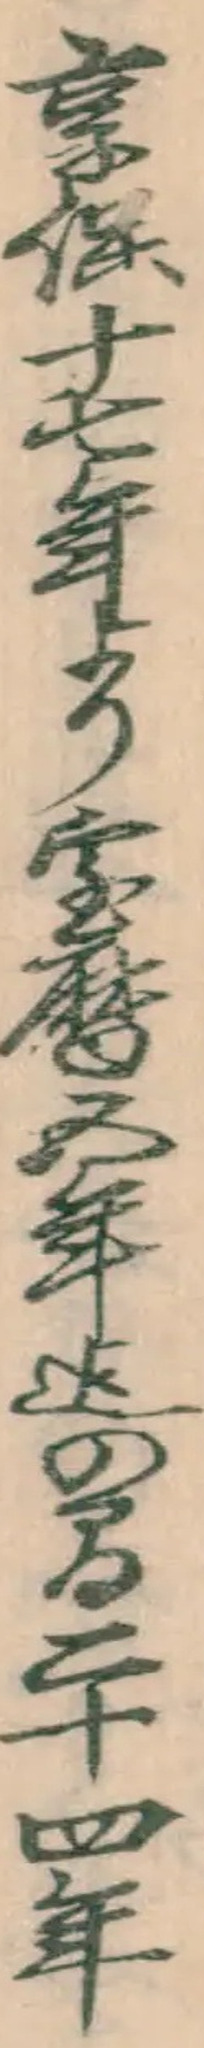享保十七年より宝暦五年迄の間二十四年
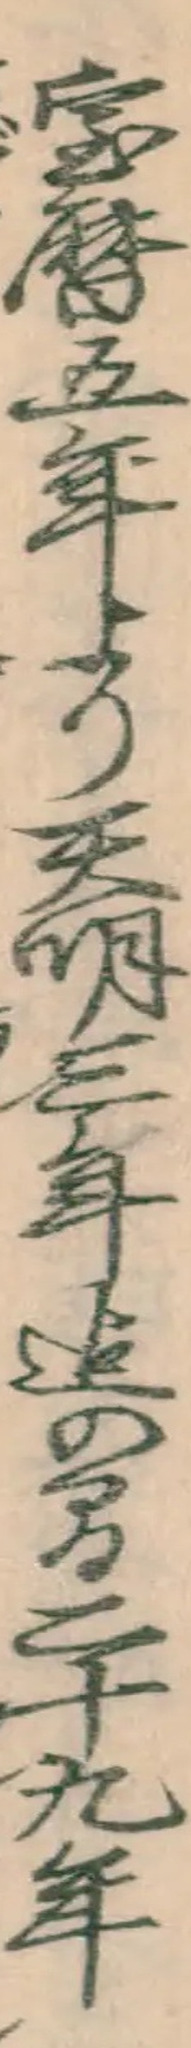宝暦五年より天明三年迄の間二十九年
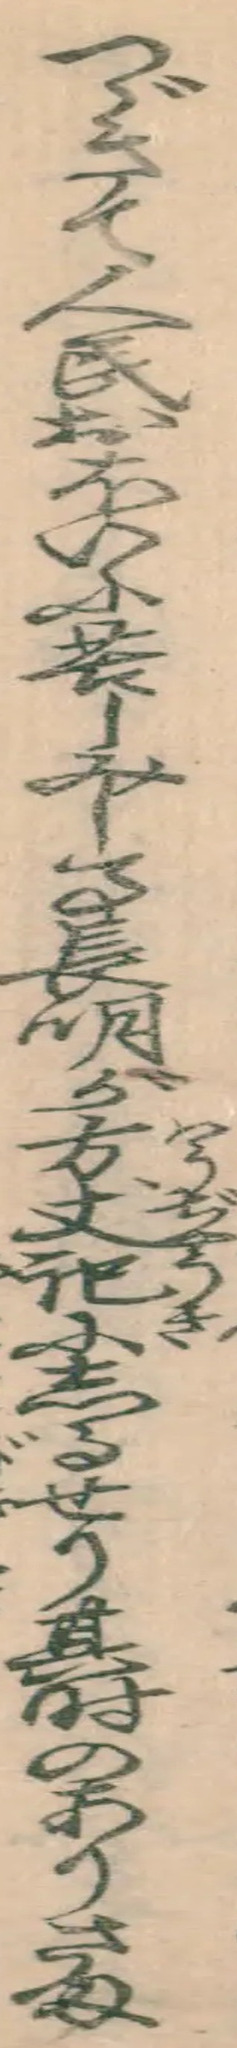つゞきて人民おほいに苦しみし事長明が方丈記にしるせり其時のありさま
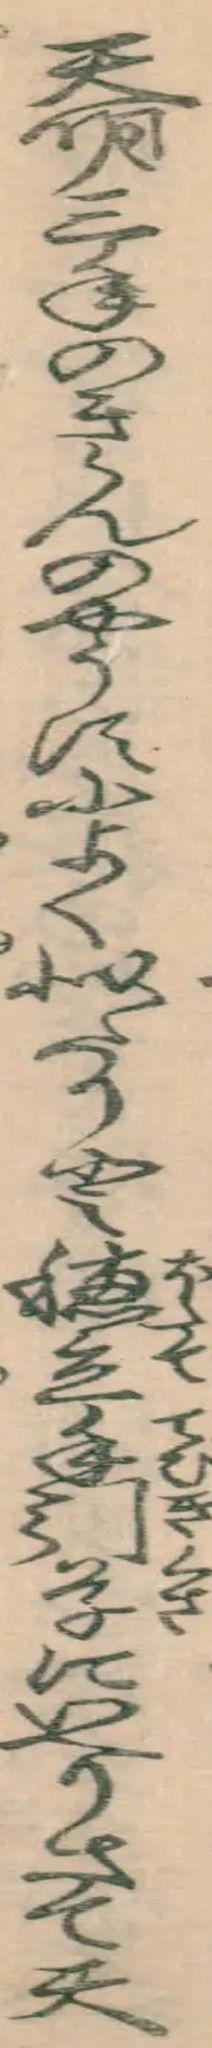天明三年のきゝんのやうすによく似たりと穂立手引草にいへりさて天
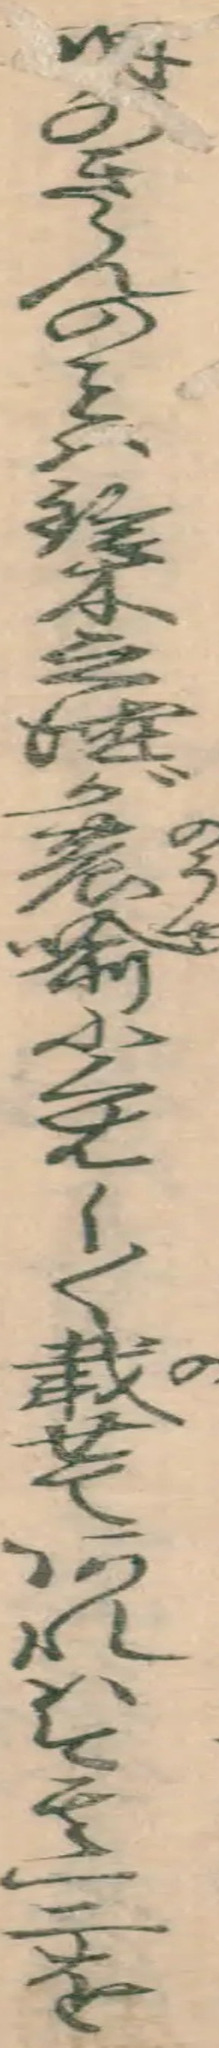明のきゝんのことは鈴木之徳が農喩にくはしく載せてあれは今其一二を
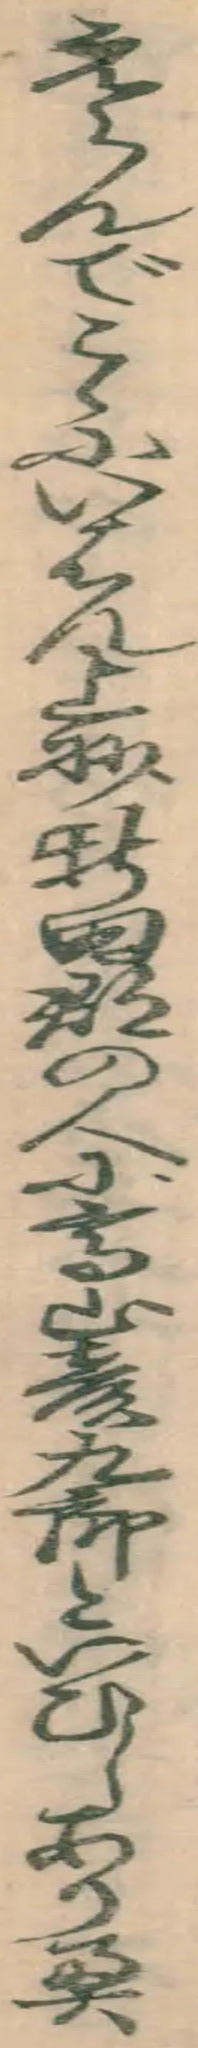えらんでこゝにいはん上州新田郡の人に高山彦九郎といひしあり奧

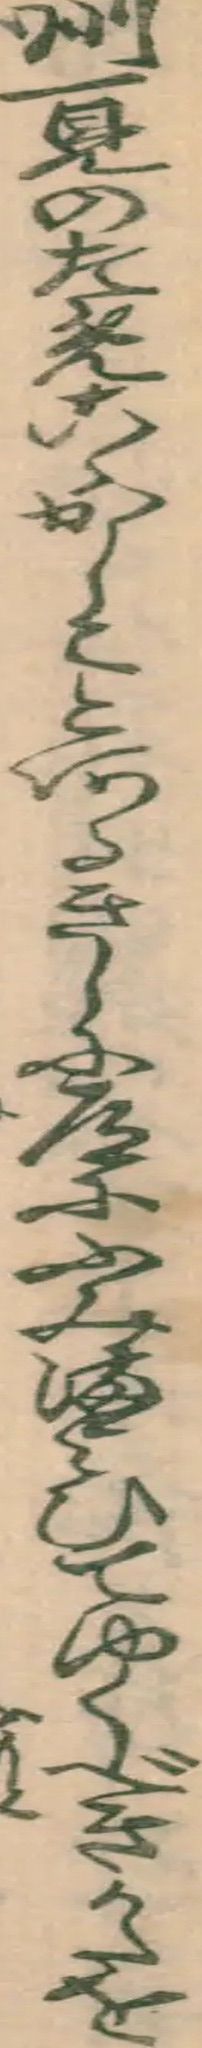州一見のためこゝかしことあるきしに道にふみまよひてゆくべきかたを
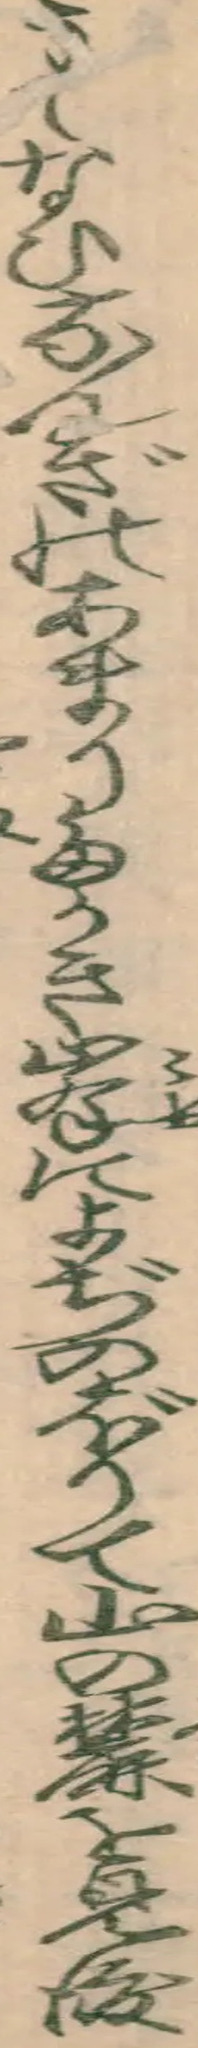うしなひなんぎのあまりたかき峯によぢのぼりて山の麓を見渡
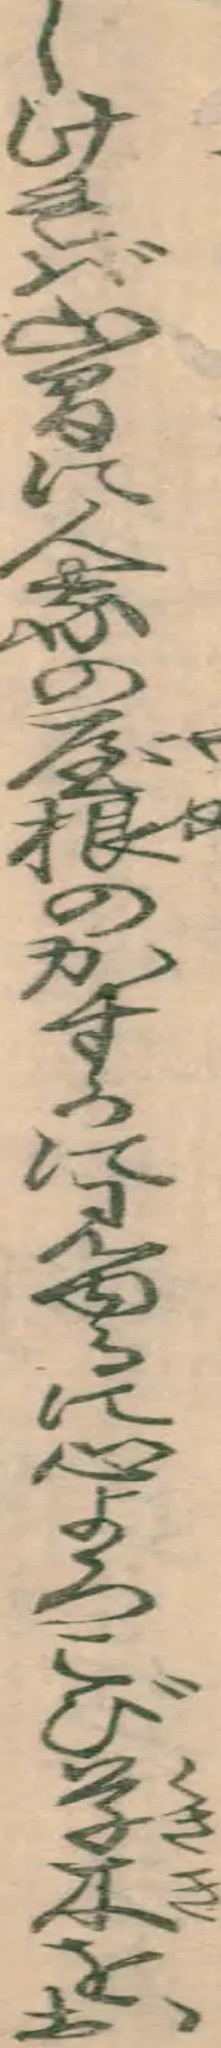しければ山間に人家の屋根のかすかに見ゆるに心よろこび草木をお
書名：日ごとの心得
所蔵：国立国会図書館 National Diet Library, JAPAN
